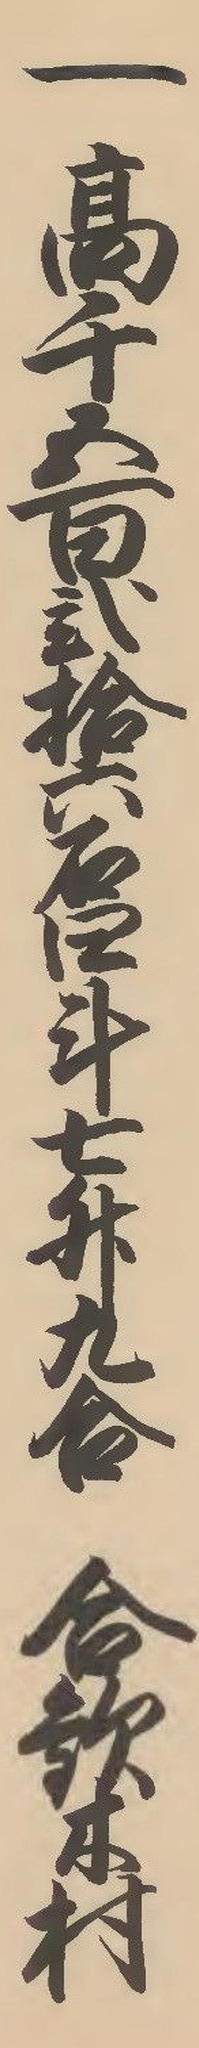一高千五百弐拾六石四斗七升九合合歓木村
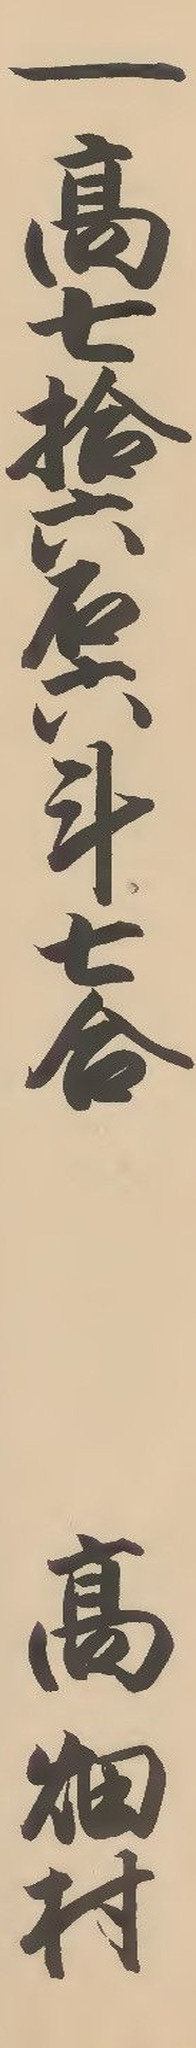一高七拾六石六斗七合高畑村
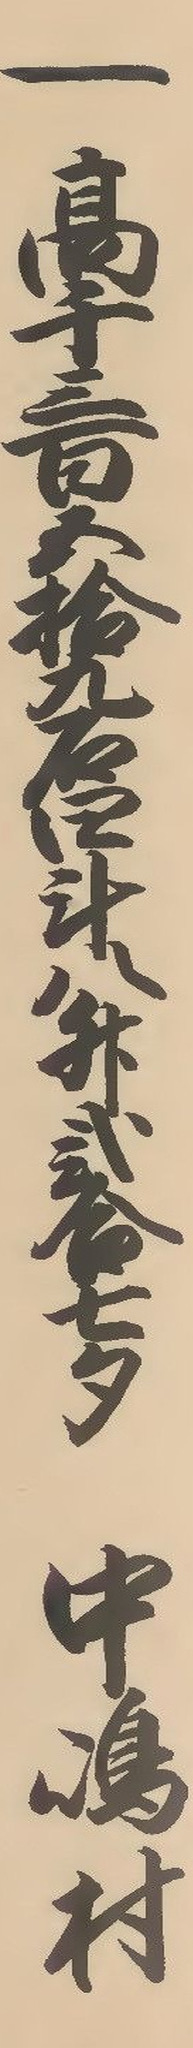一高千三百五拾九石四斗八升弐合七勺中島村
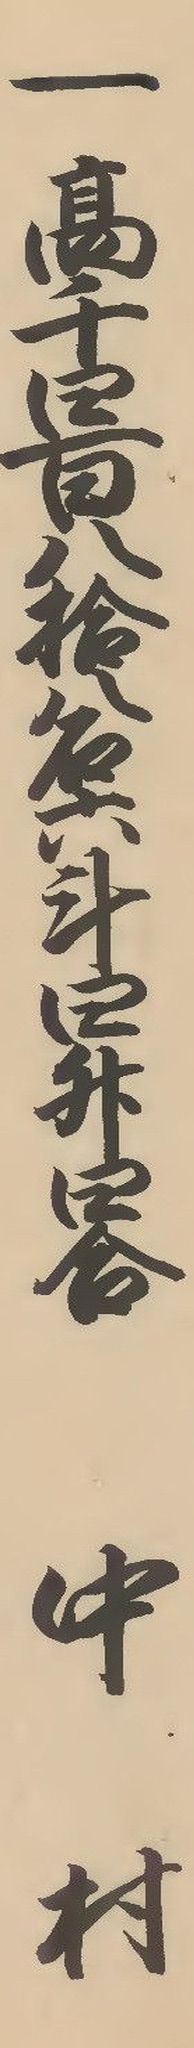一高千四百八拾八石六斗四升四合中村
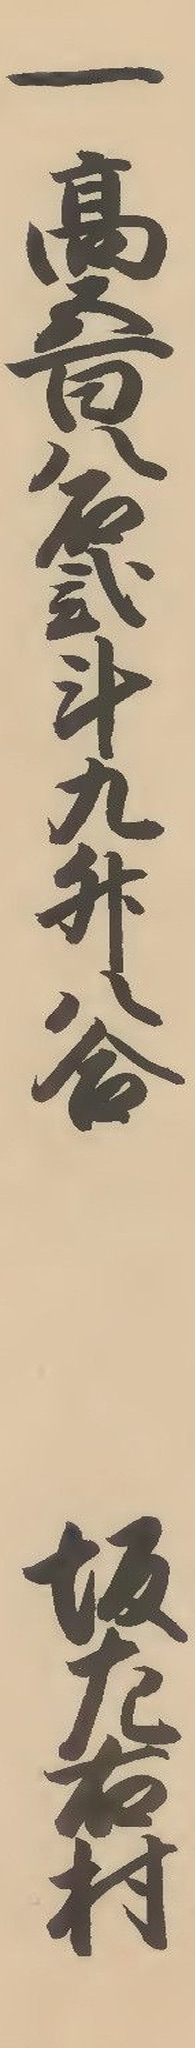一高五百八石弐斗九升八合坂左右村
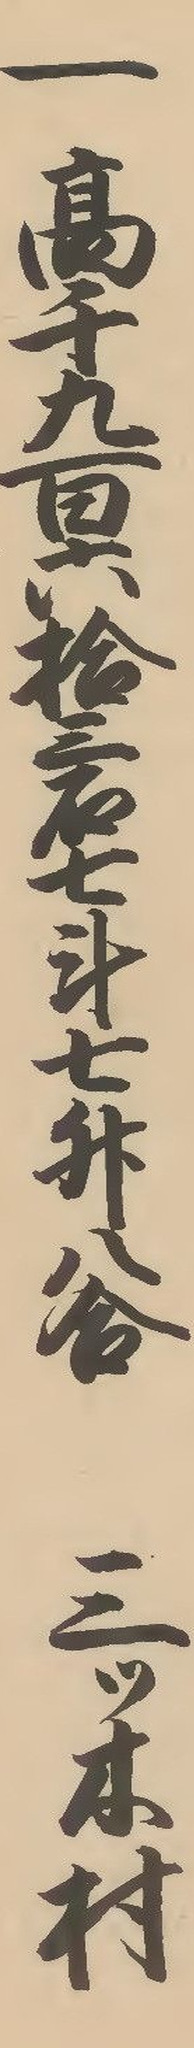一高千九百六拾三石七斗七升八合三ツ木村

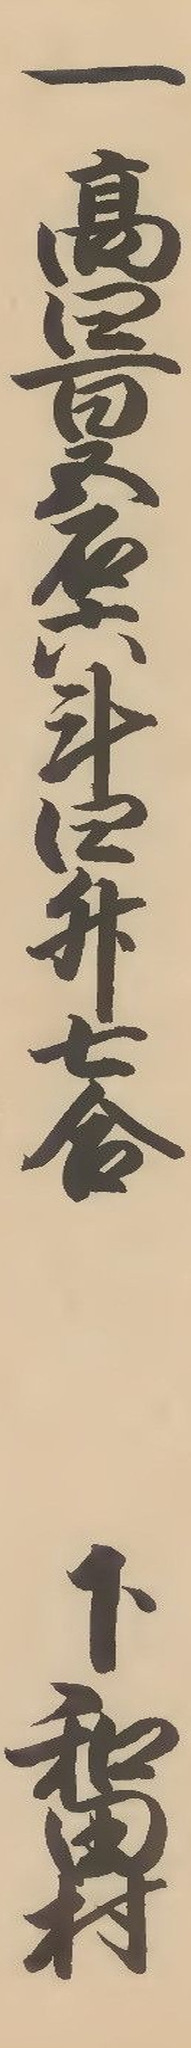一高四百五石六斗四升七合下和田村
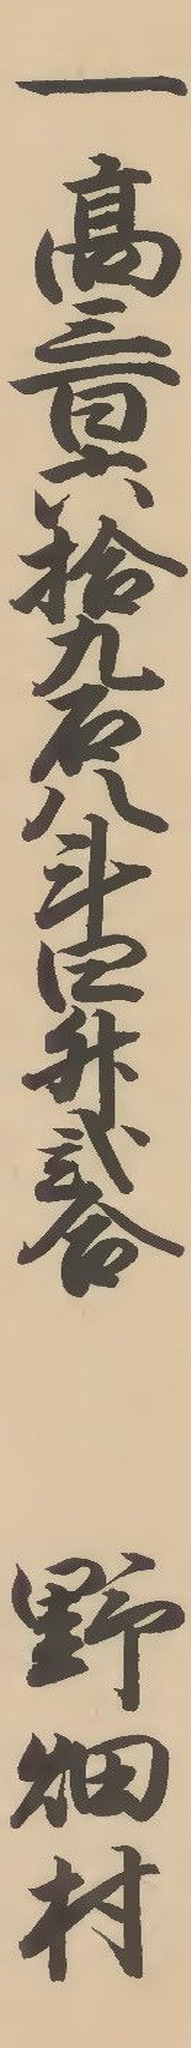一高三百六拾九石八斗四升弐合野畑村
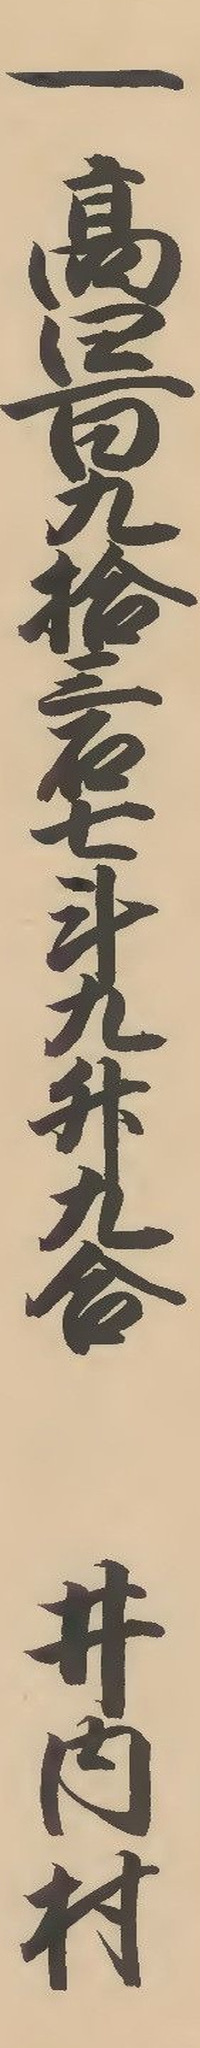一高四百九拾三石七斗九升九合井内村
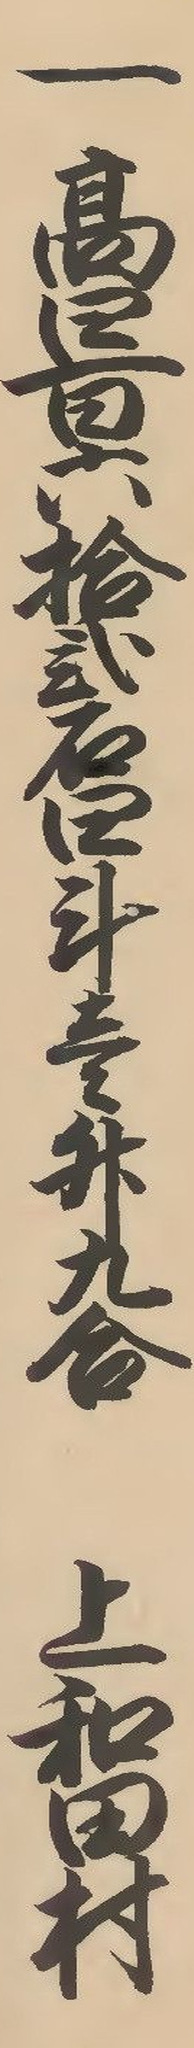一高四百六拾弐石四斗壱升九合上和田村
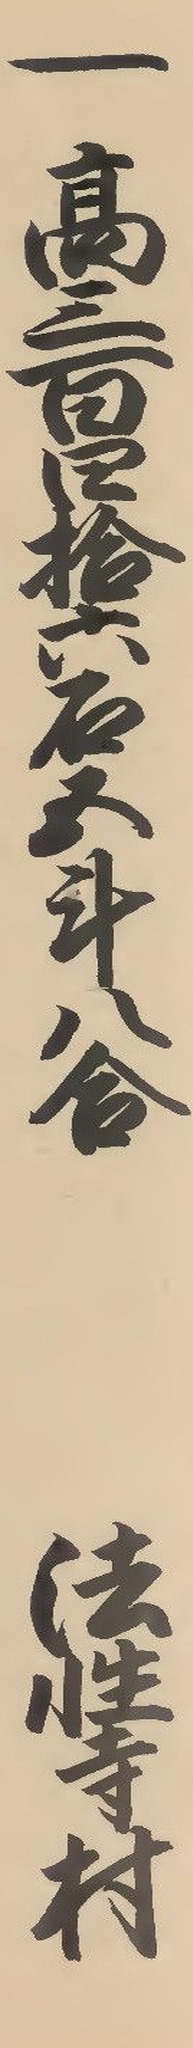一高三百四拾六石五斗八合法性寺村
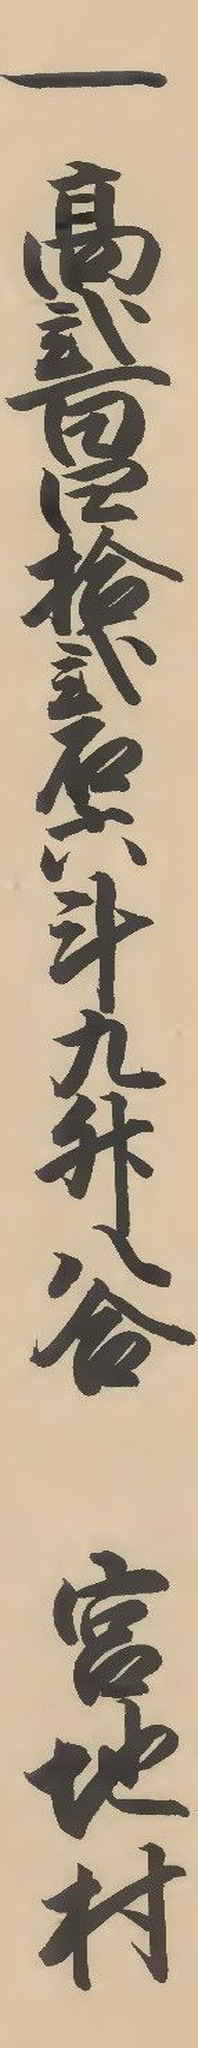一高弐百四拾弐石六斗九升八合宮地村
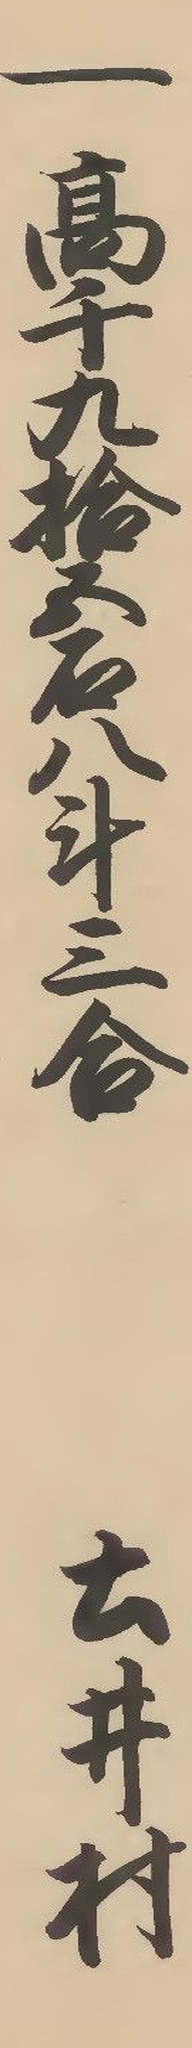一高千九拾五石八斗三合土井村
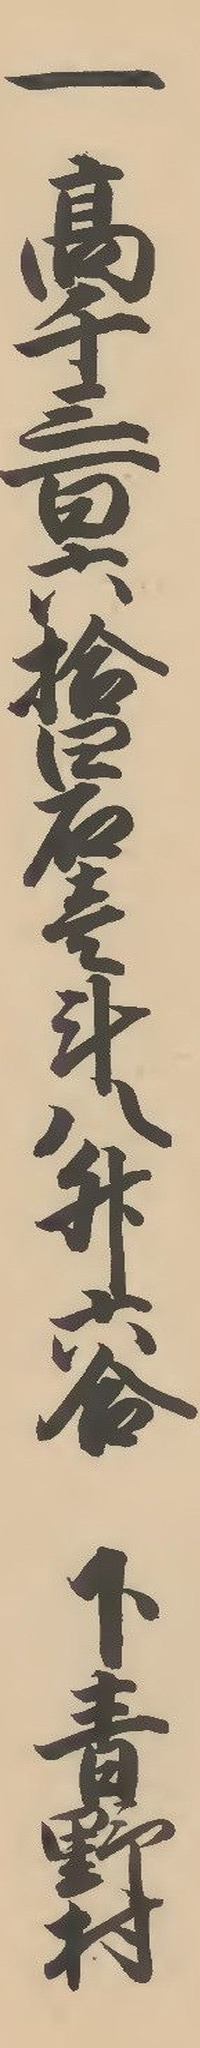一高千三百六拾四石壱斗八升六合下青野村

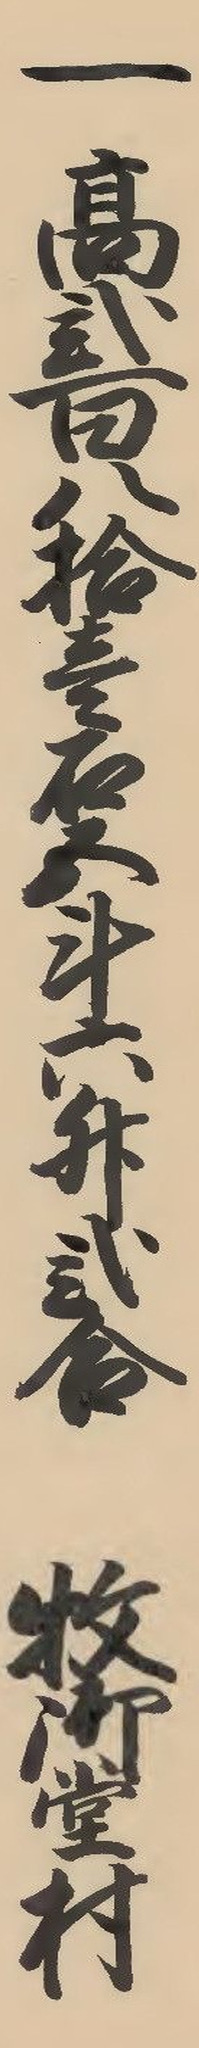一高弐百八拾壱石五斗六升弐合牧御堂村
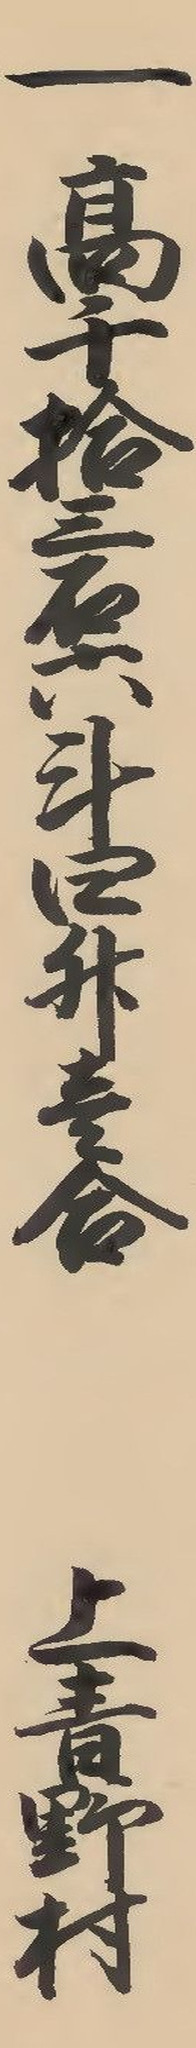一高千拾三石六斗四升壱合上青野村
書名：三河国郷帳
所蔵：国立公文書館 National Archives of Japan
